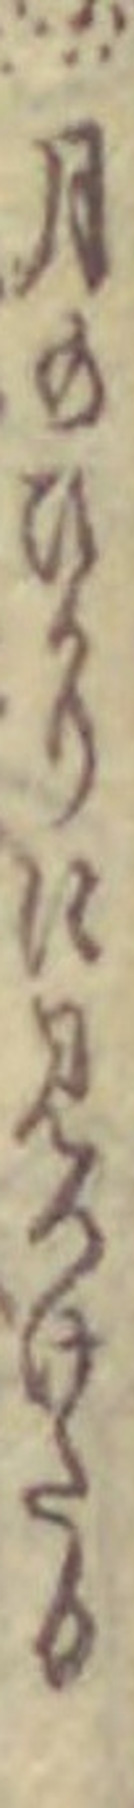月のひかりに見つけたる
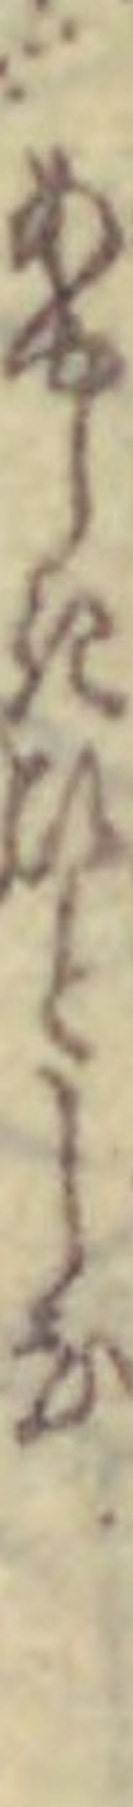あやしきひとしな
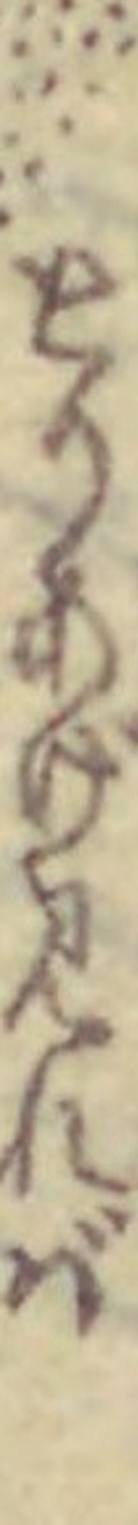とりあげ見れば
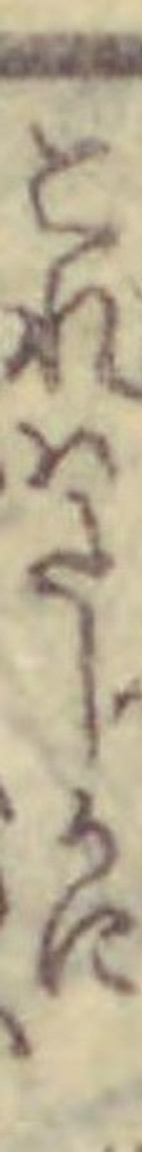これはたじかに
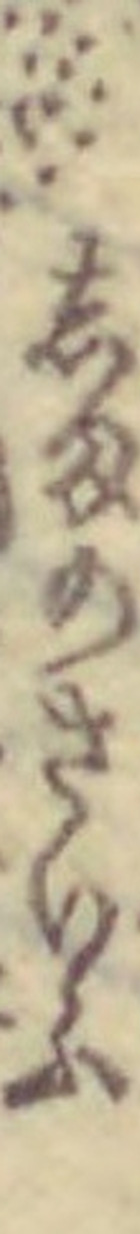しまのさいふ
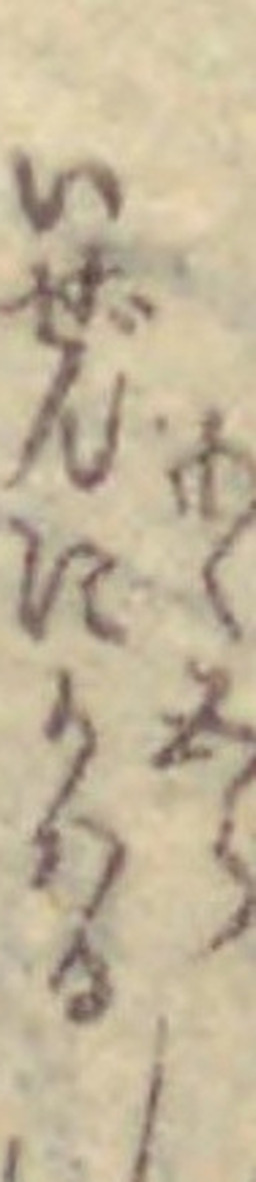いぜんにかはる
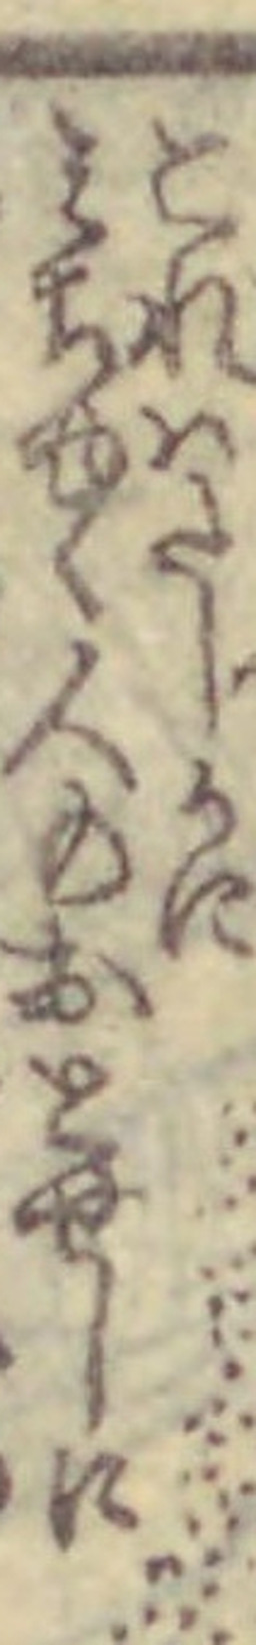みちゆく人のおとせしに
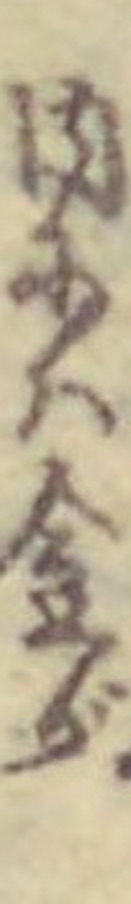内には金が
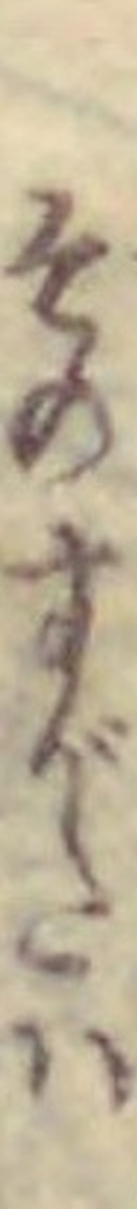そのすがたは
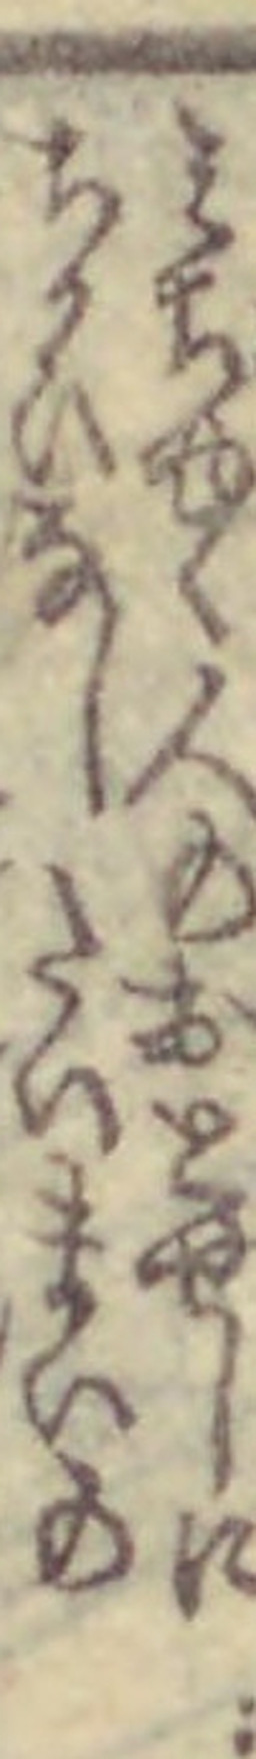ちかひなしたいまいの
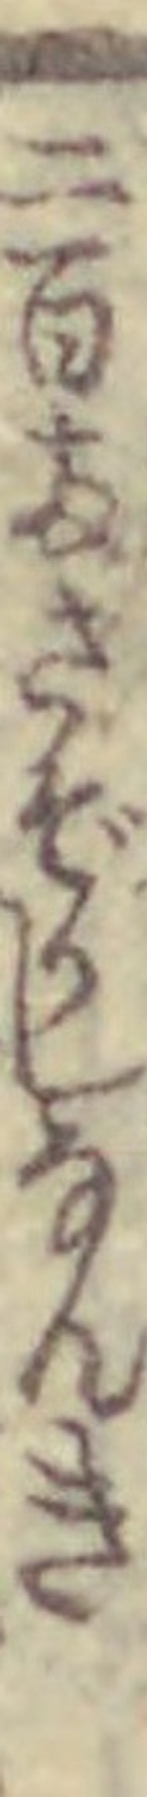二百両さぞかしなんき
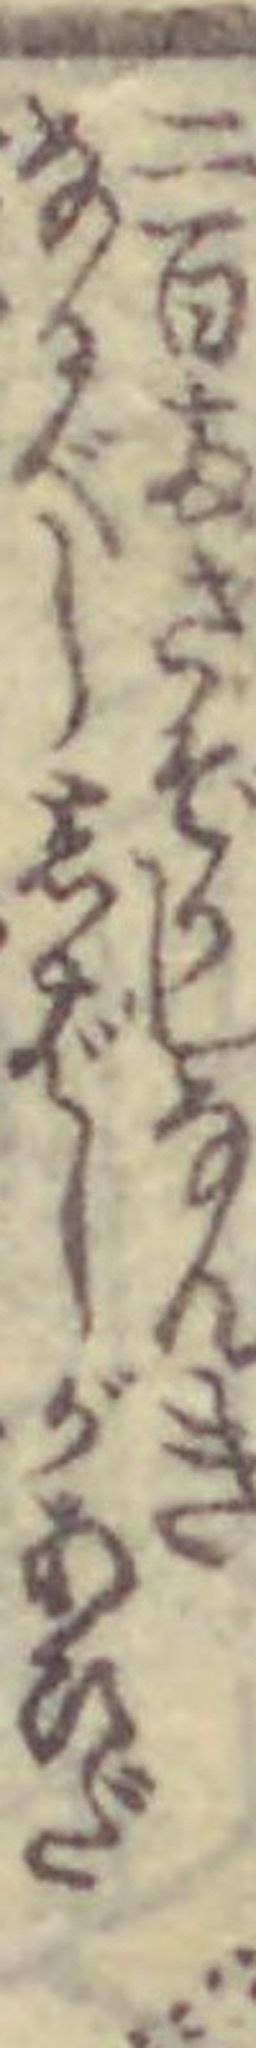なるべししばしがあひだ
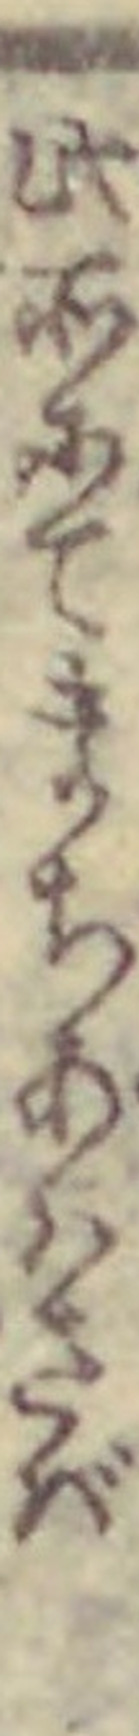此所にてまちあはさば
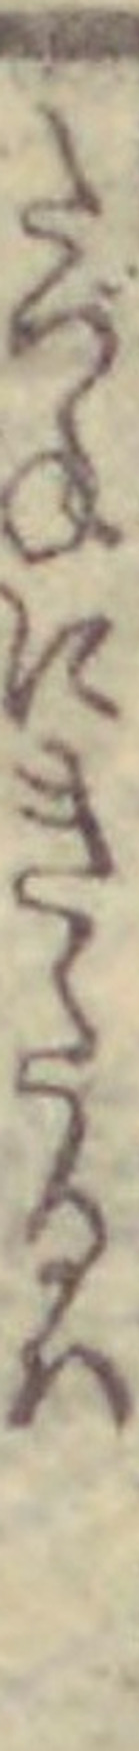たづねにきたるは
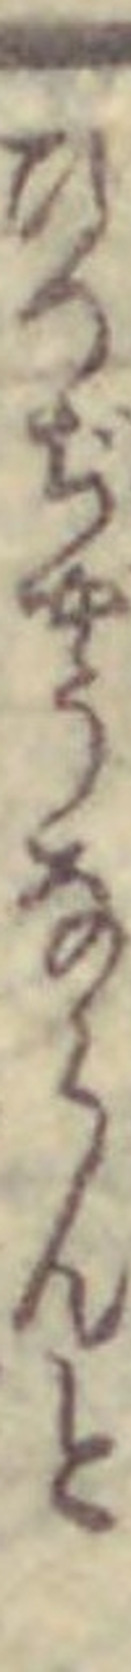ひつぢやうならんと
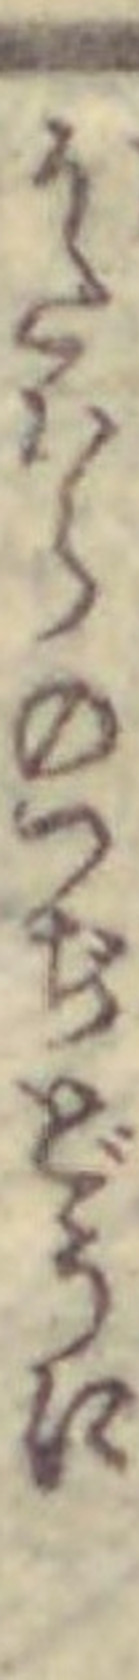かたはらのつぢどうに
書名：八ツ目鱣因縁物語 3巻
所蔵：国立国会図書館 National Diet Library, JAPAN
